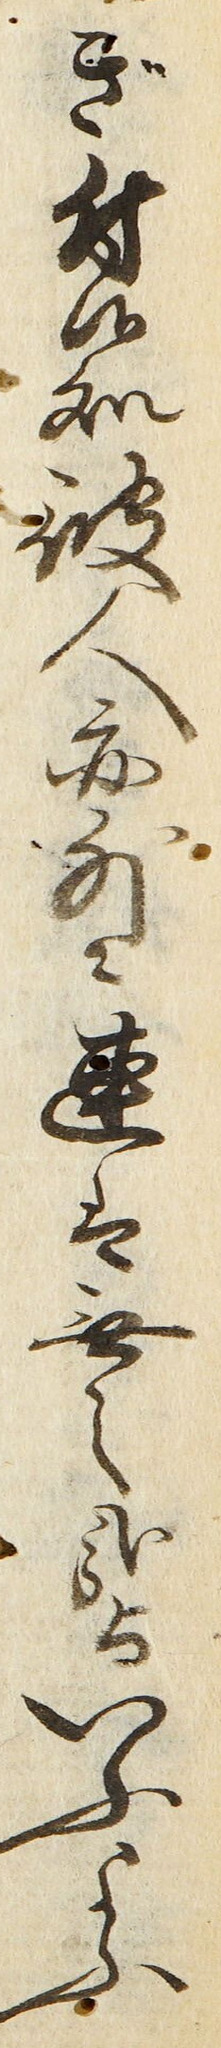ぎ付候処彼人亦外ニ連は無之哉といふよふ
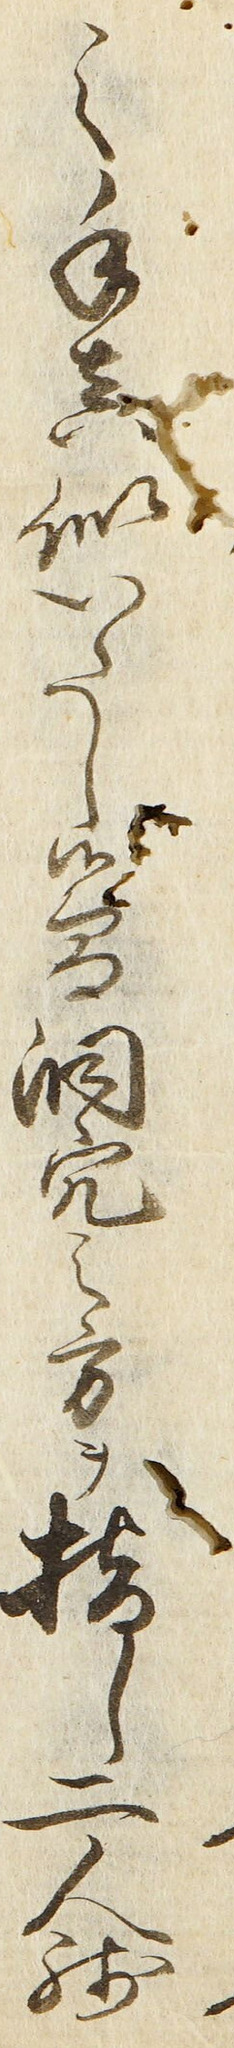之手真似いたし候間洞穴之方ヲ指し二人残
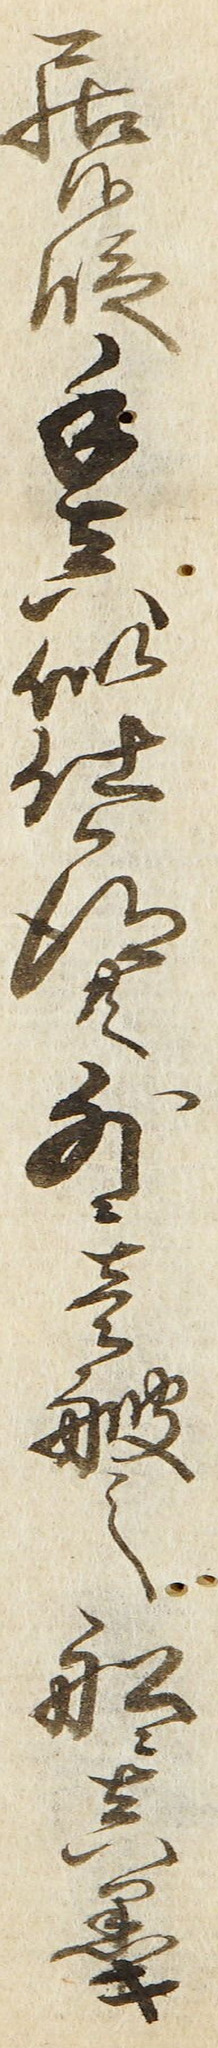居候段手真似仕候得共外ニ壱艘之舩ニ真黒キ
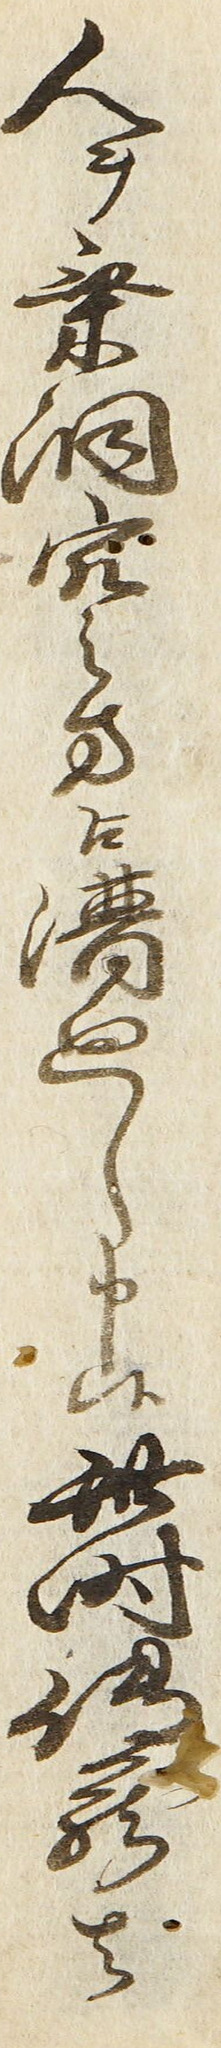人ヲ乗洞穴之方江漕廻し申候此時傳蔵者
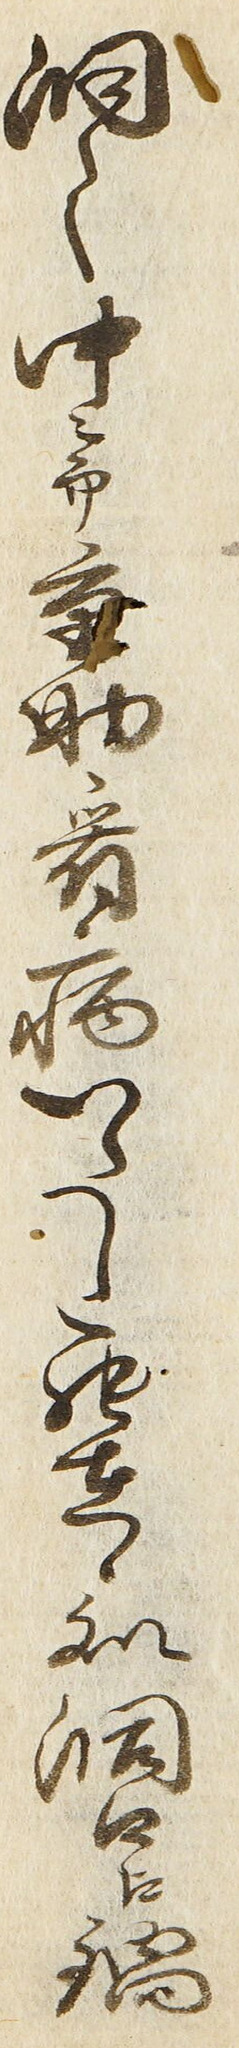洞之中ニ而重助看病いたし罷在候処洞口江鍋
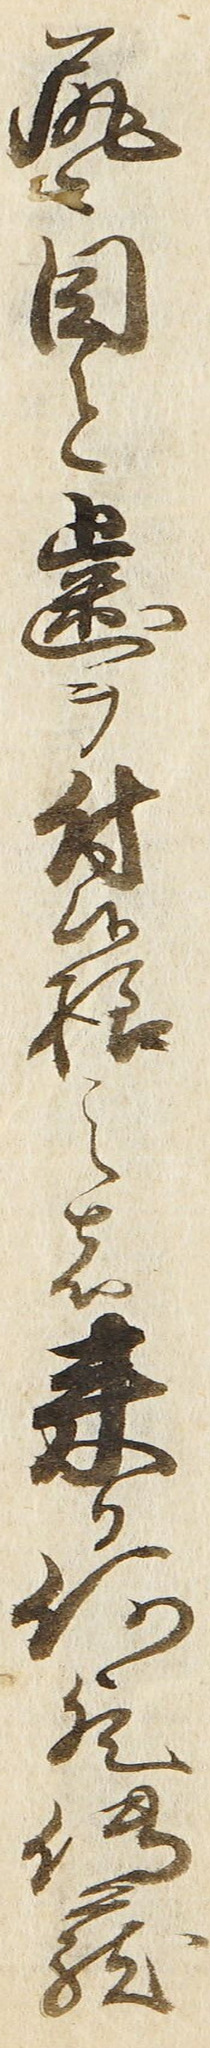尻ニ目と歯ヲ付候様之者来り何欤傳蔵
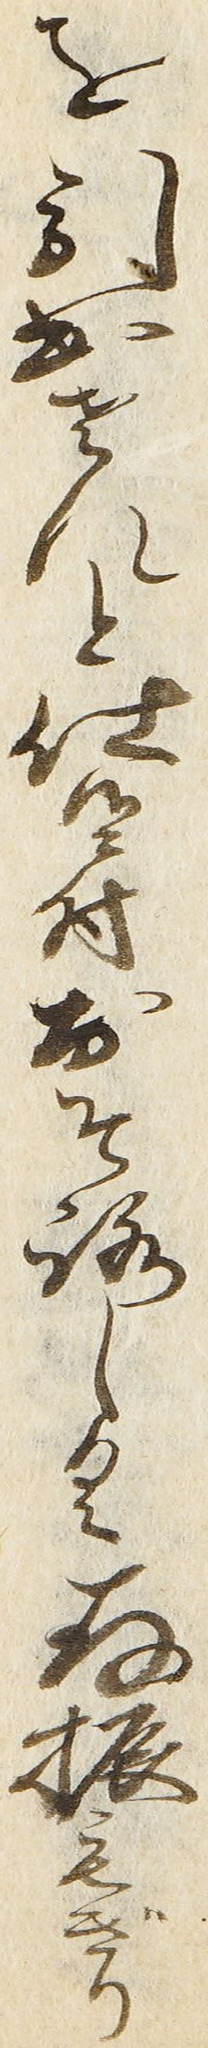を引出せんと仕候ニ付おそろしく存振もぎり
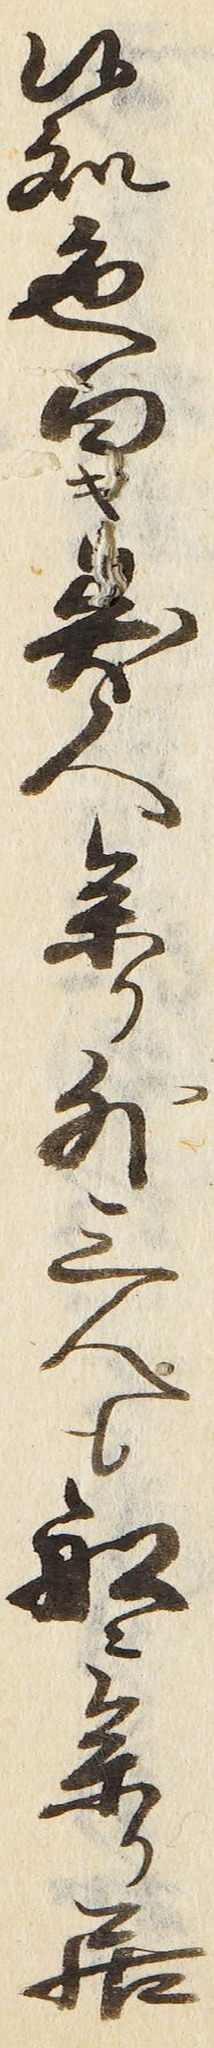候処色白キ異人参り外三人も舩ニ参り居
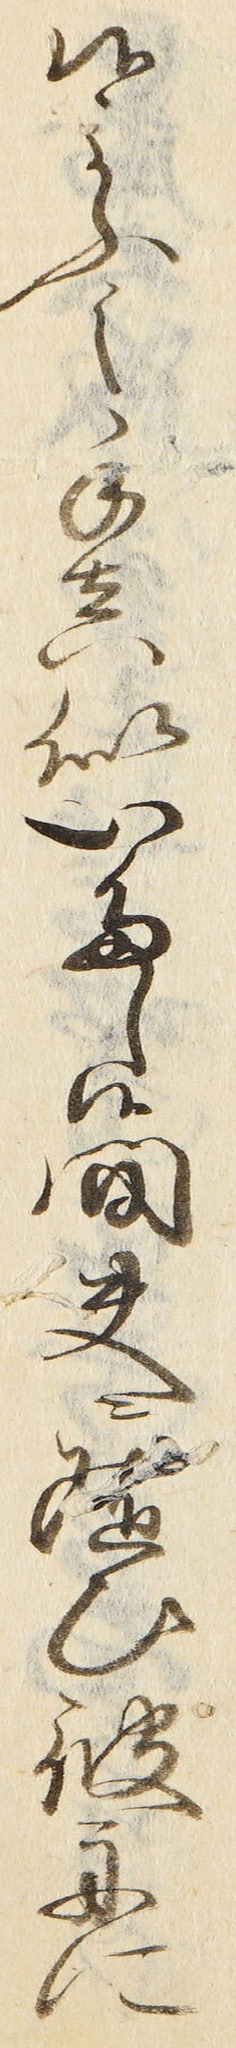候よふ之手真似いたし候間夫ニ随ひ彼舟に
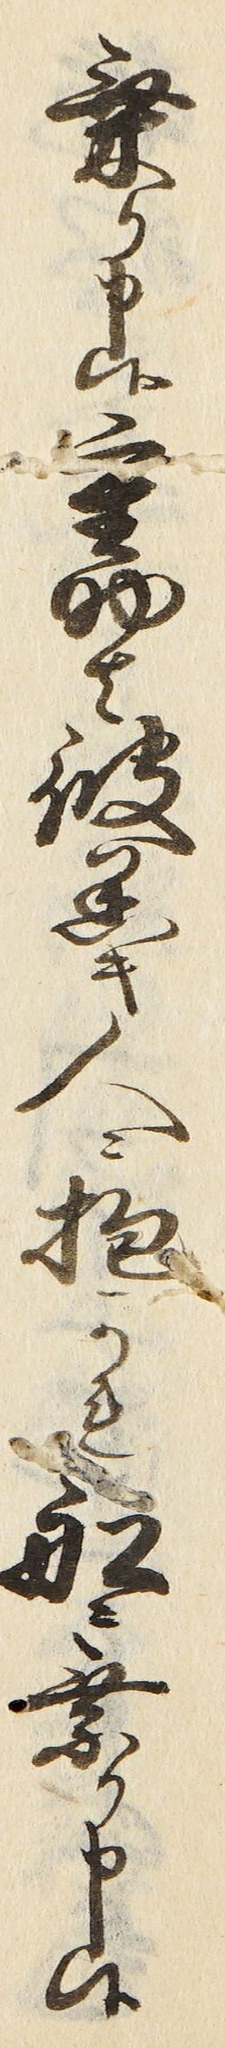乗り申候重助者彼黒キ人ニ抱かれ舩ニ乗り申候
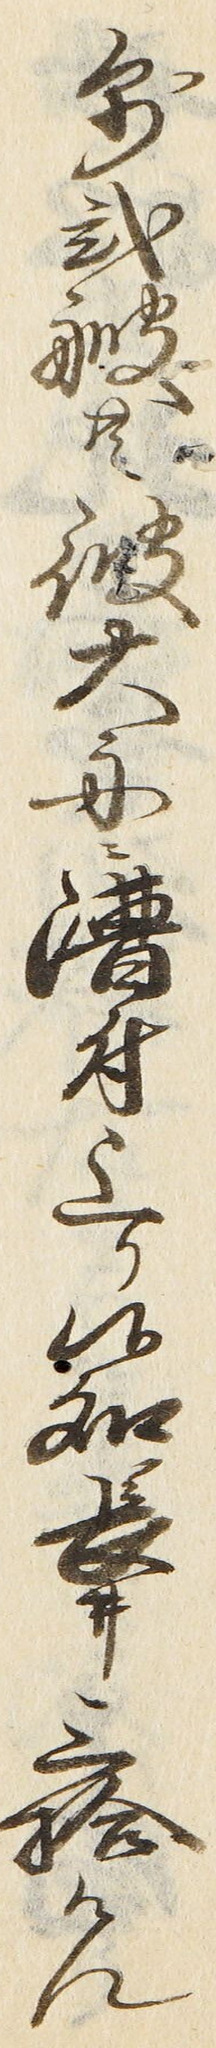則弐艘共彼大舟に漕付上り候処長サ三拾けん
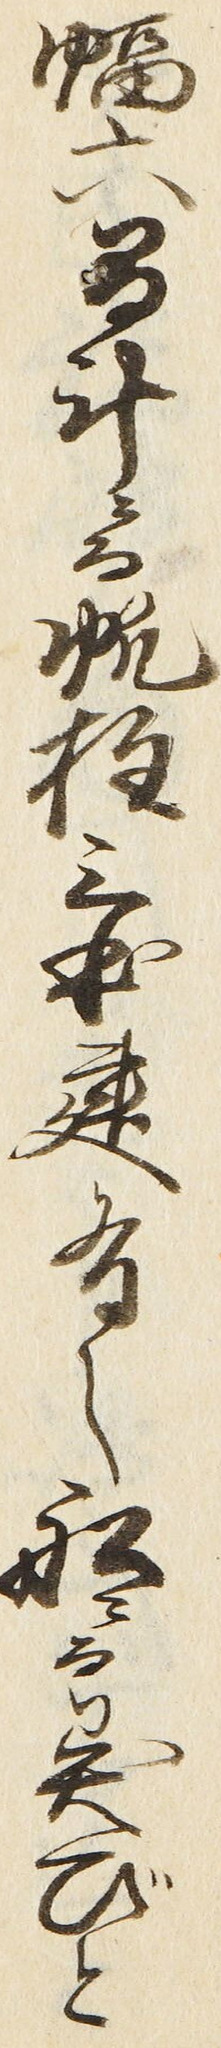幅六間斗ニ而帆柱三本建有之舩ニ而異びと
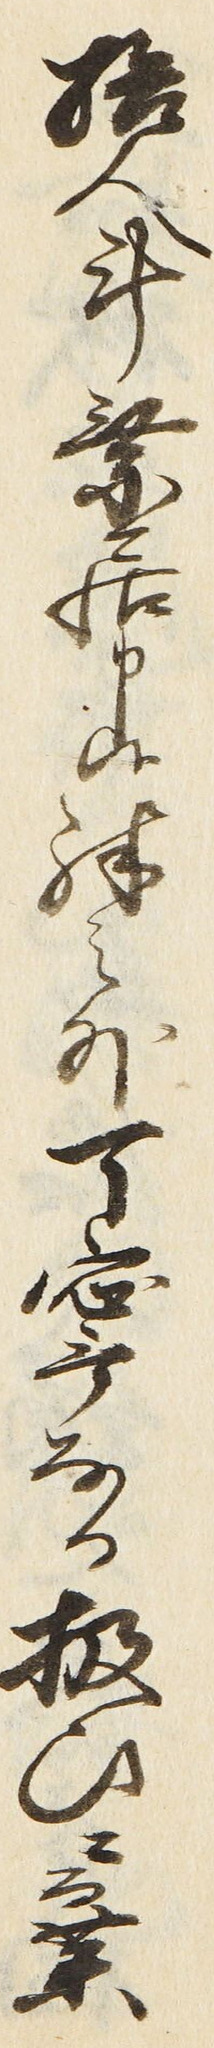拾人斗乗居申候殊之外丁寧なる扱ひニ而薬
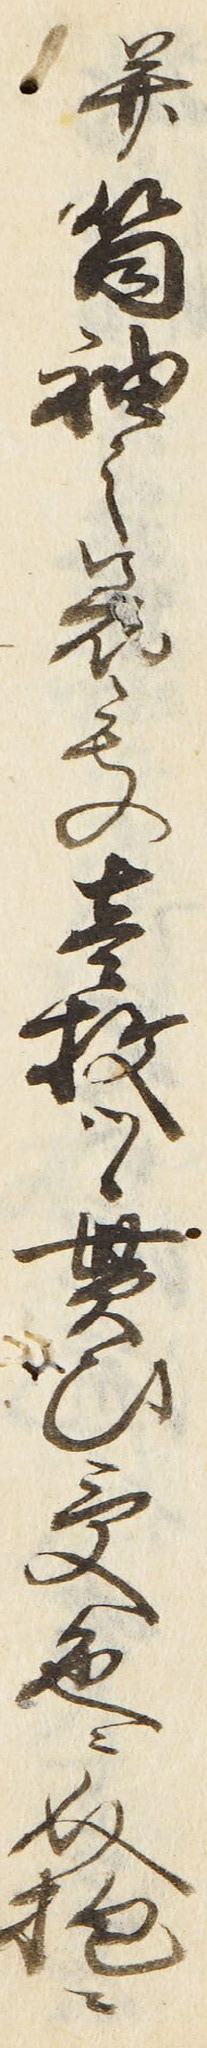幷筒袖之着もの壱枚ツヽ貰ひ受色々介抱ニ
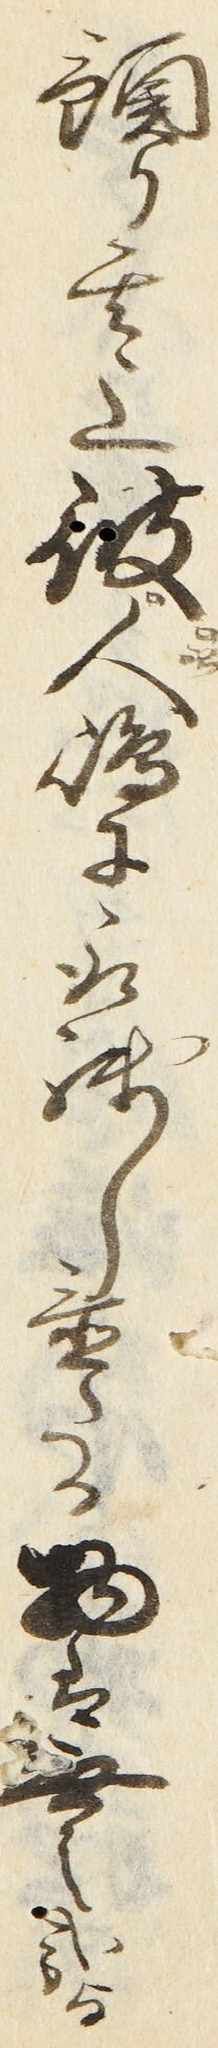預り其上彼人嶋に取残し置たる物は無之哉と
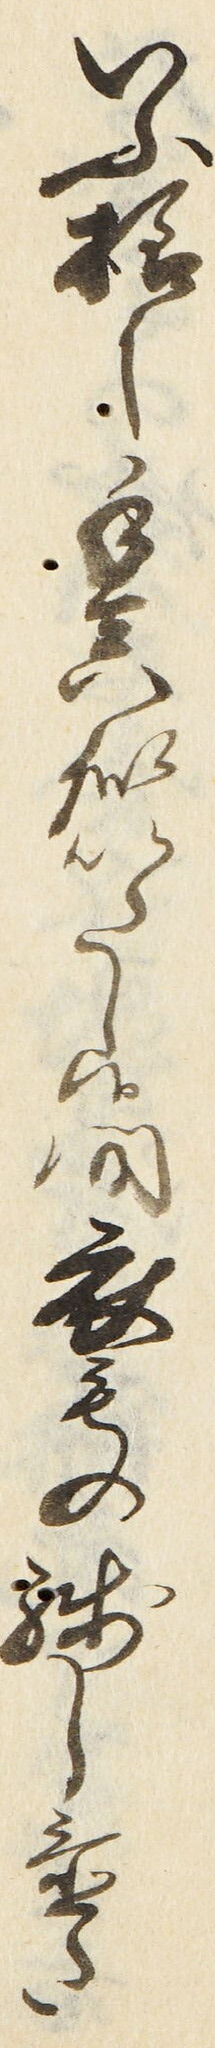いふ様之手真似いたし候間衣もの残し置た
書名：漂客談寄
